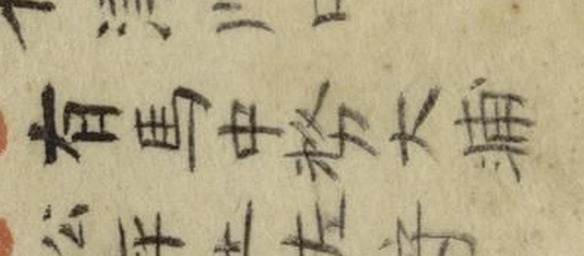〇有馬中務大輔
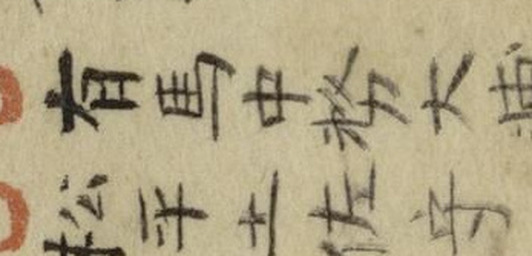〇有馬中務大輔
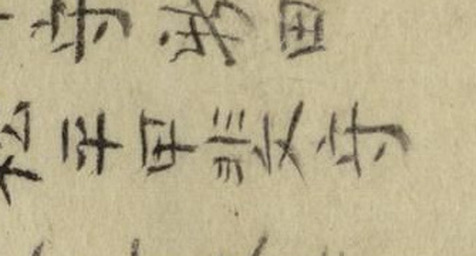松平薩摩守
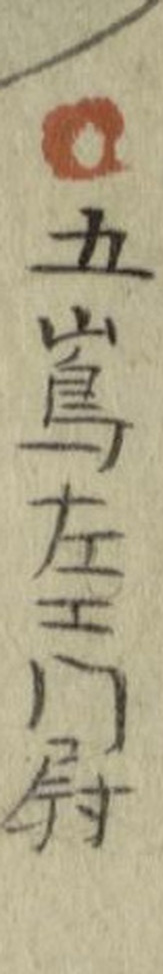〇五嶌左衛門尉
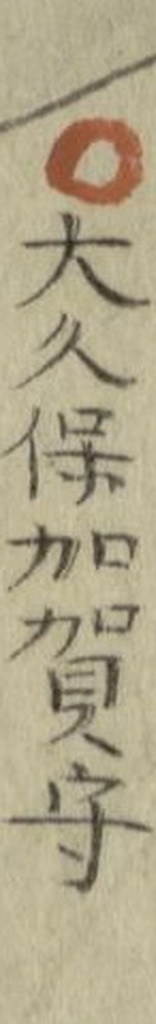〇大久保加賀守
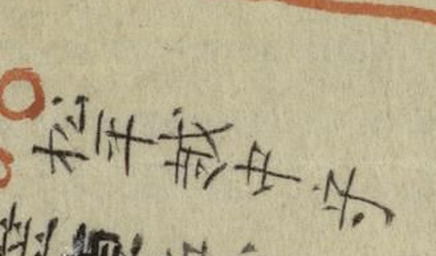松平薩摩守
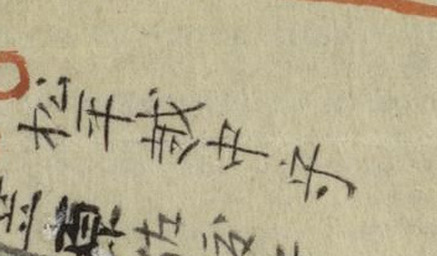松平薩摩守
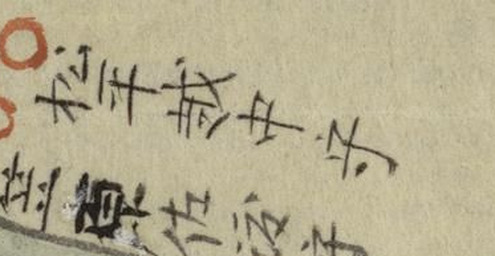松平薩摩守
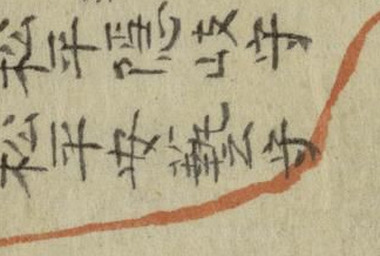松平薩摩守
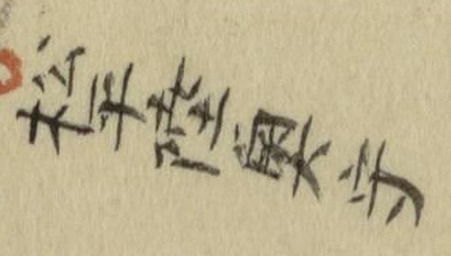松平薩摩守
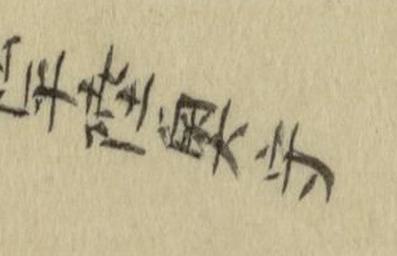松平薩摩守
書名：摂刕大坂天保山御固繪図　嘉永七寅年九月魯西亜舩渡来之節
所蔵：東京大学地震研究所図書室 Earthquake Research Institute Library, The University of Tokyo, JAPAN
